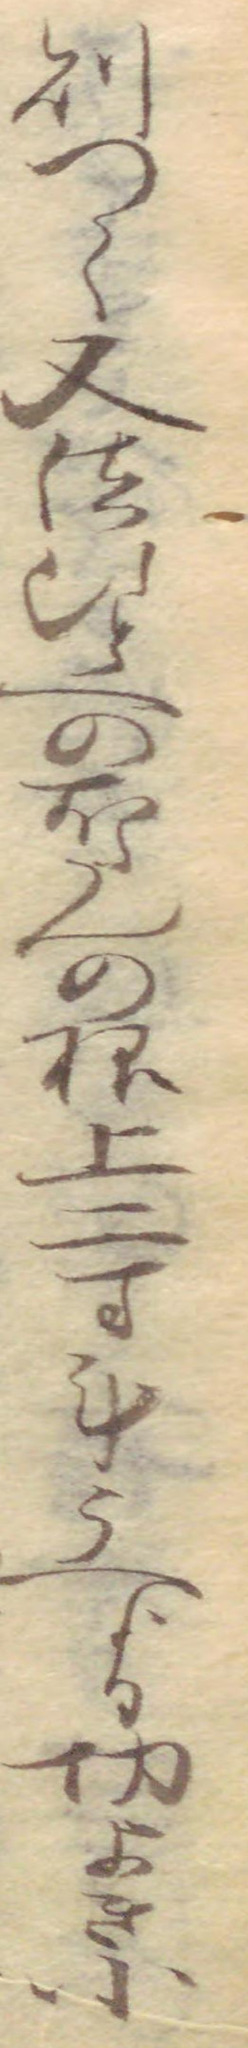則つく又法ひとへのほたんの根上二寸斗枝にうへより切よき小
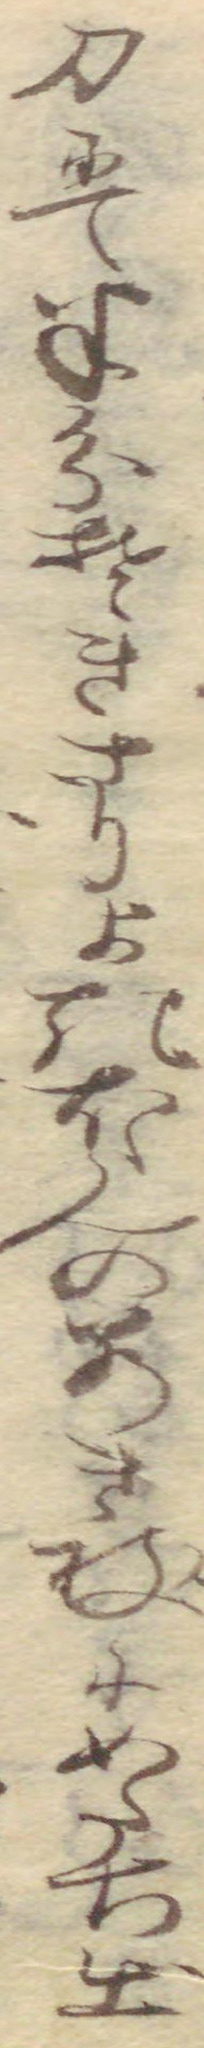刀にて半分そきさりよきほたんの若き枝にめたち出
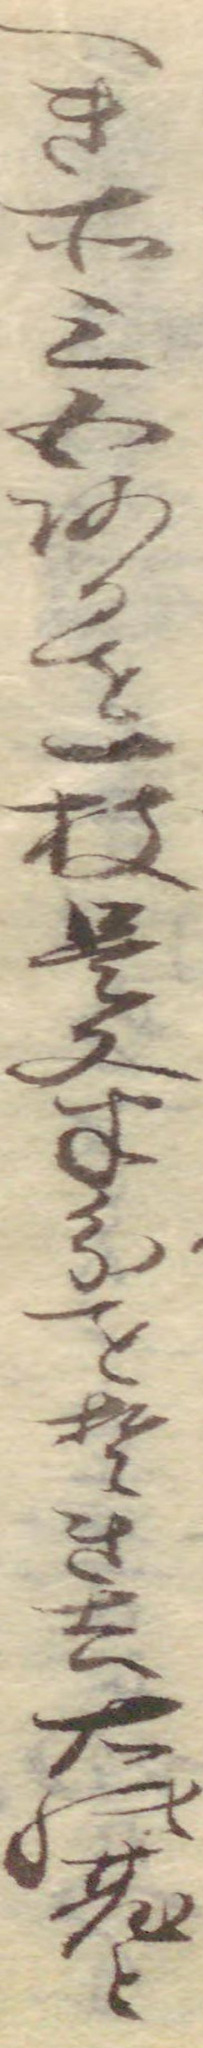へき所三五あるを一枝是又半分をそき去右の臺と
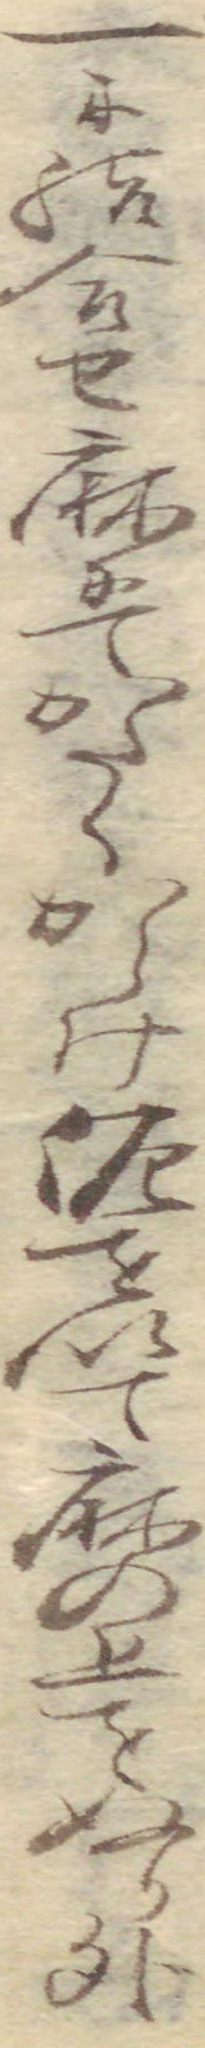一に結合せ麻にてかたくからけ泥を以て麻の上をぬり外
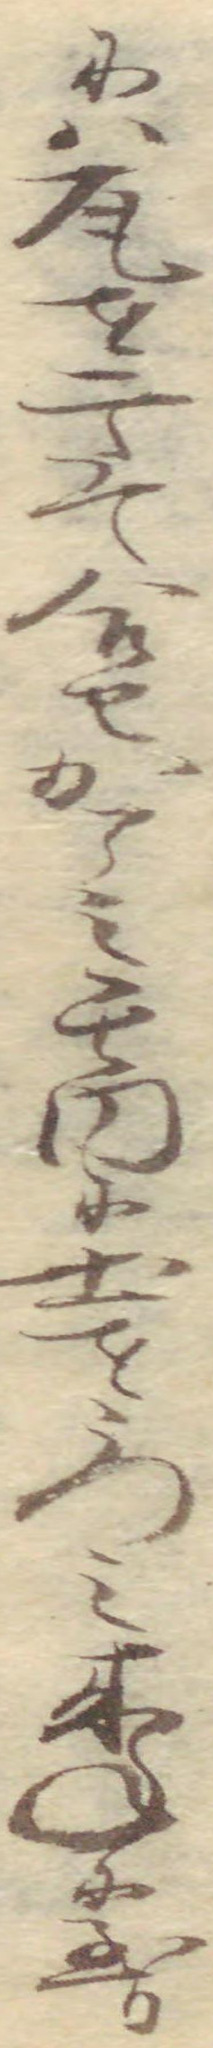にハ瓦を二たて合せかこミ其内に土をうつミ来年に至り
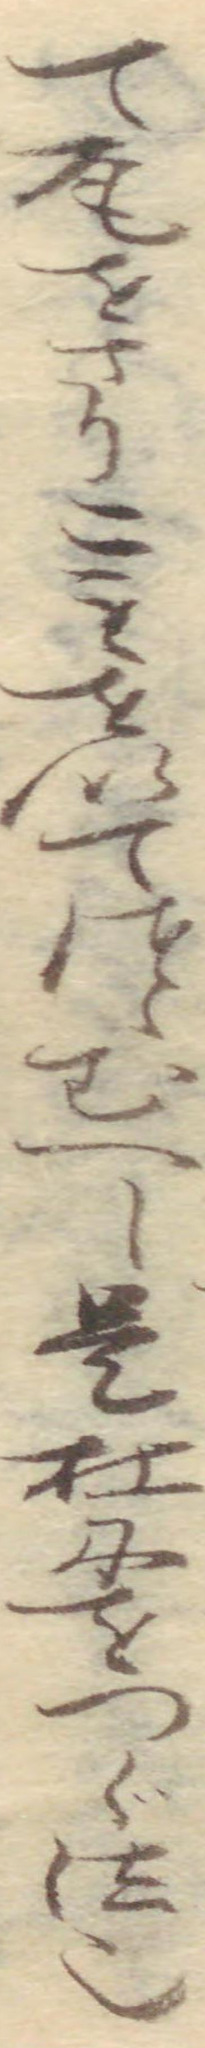て瓦をさりこもを以てつゝむへし是牡丹をつぐ法也
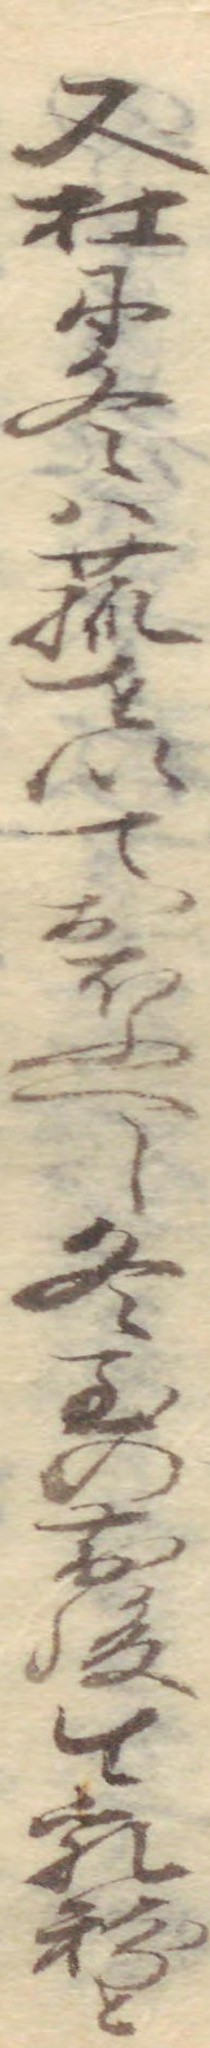又牡丹冬ハ菰を以ておほふへし冬至の前後生乳粉と
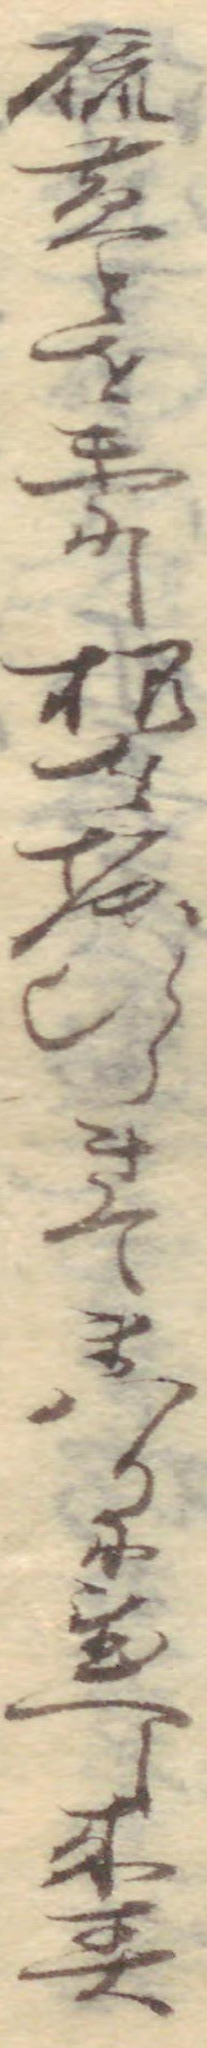硫黄とを末にし根を堀ひらきてまハりに置へし来春
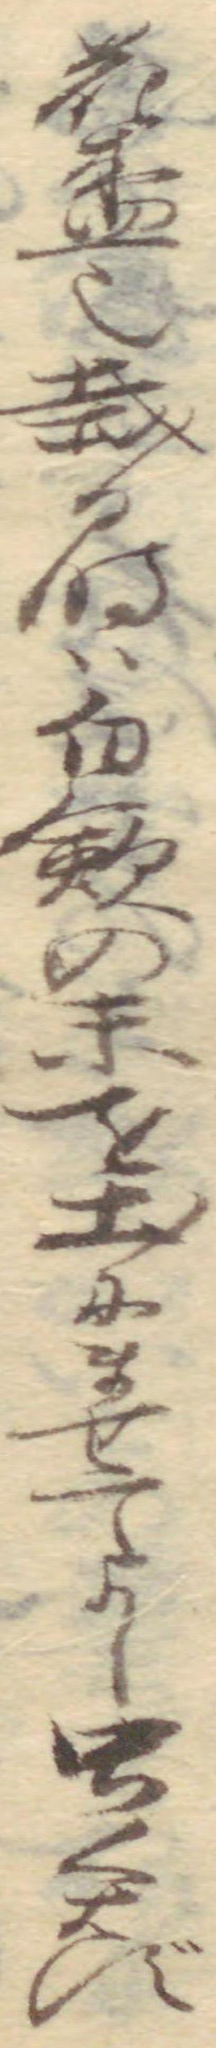花盛也栽る時ハ白斂の末を土にませてよし虫くはず
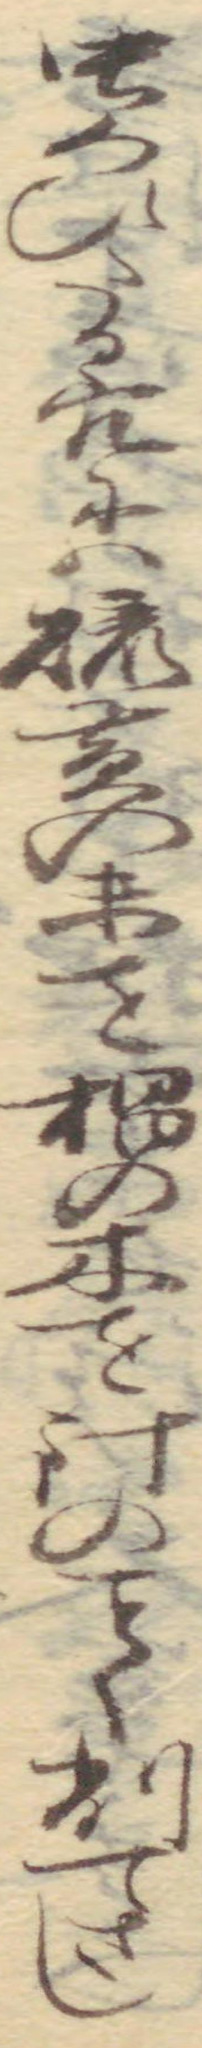虫くひたる穴にハ硫黄の末を椙の木を釘のことく削てさし
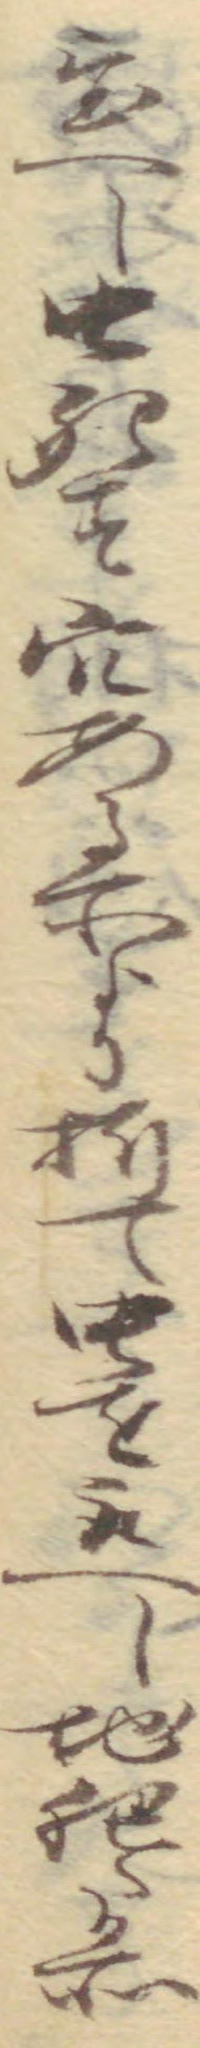置へし虫死す穴ある所より折て虫を取へし地肥たる所
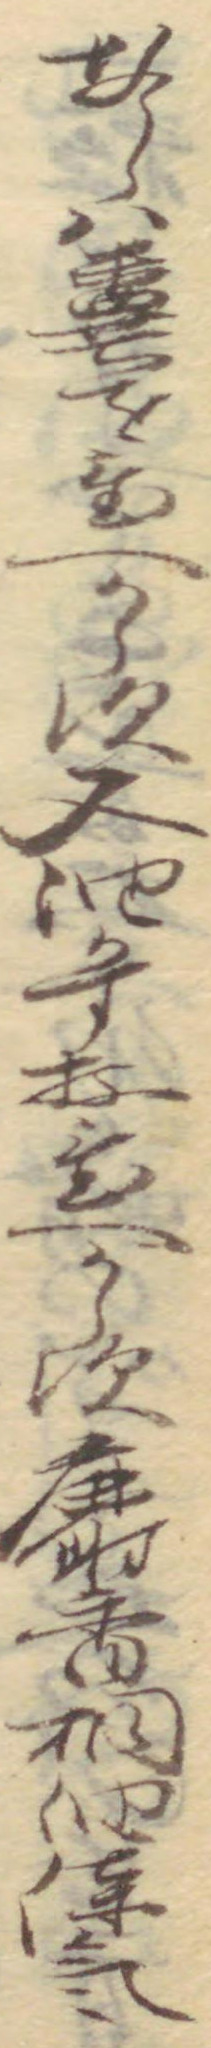ならハ糞を置へからす又油かす抔置へからす麝香桐油漆気
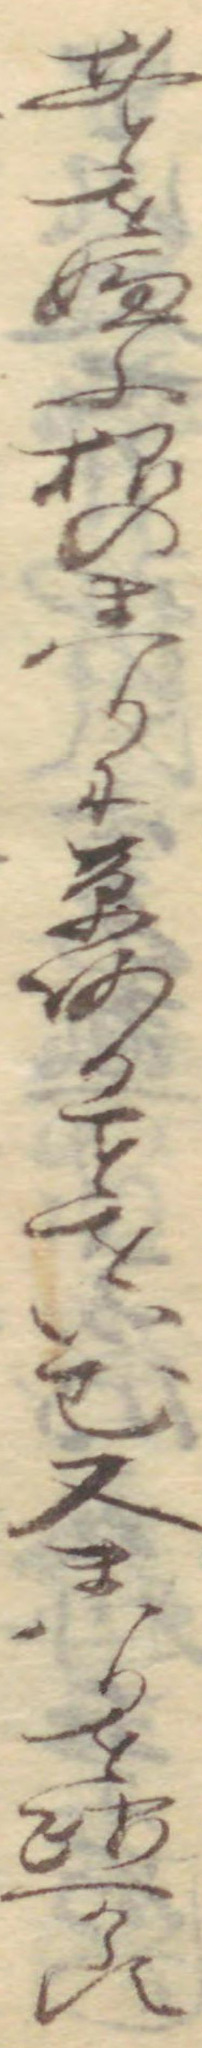なとを嫌ふ根のまハりに草あることをいむ又まはりを踏へからす
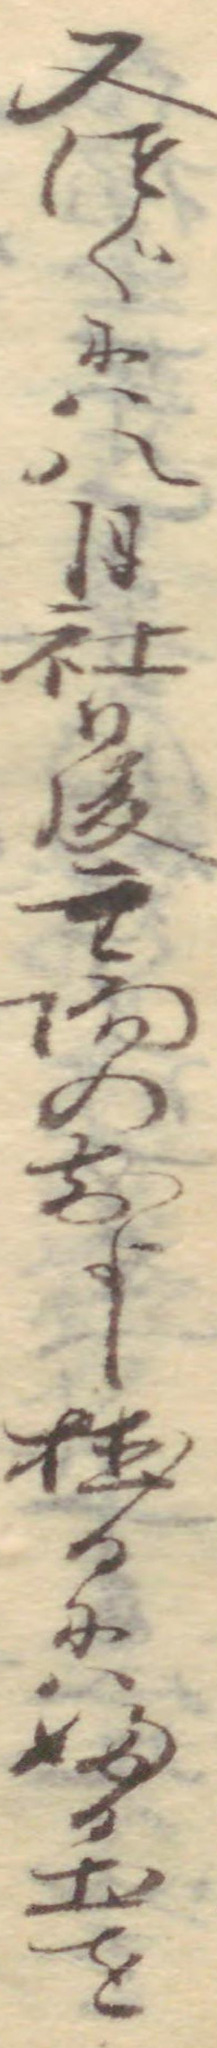又つぐにハ八月社日後重陽の前よし植るにハふる土を
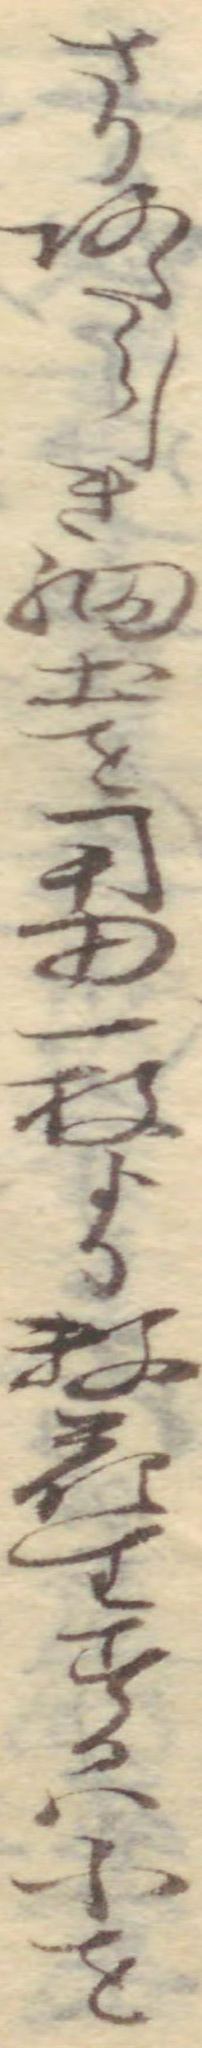さりあたらしき細土を用ゆ一枝より数花生するハ小を
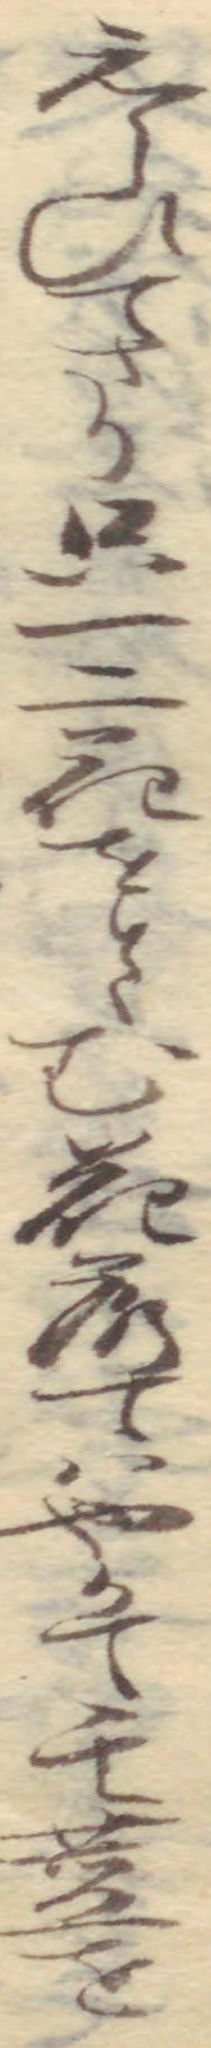えらひてさり只一二花をとゝむ花落てはやかて其茎を
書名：鶯宿雑記. 巻199-200
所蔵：国立国会図書館 National Diet Library, JAPAN
